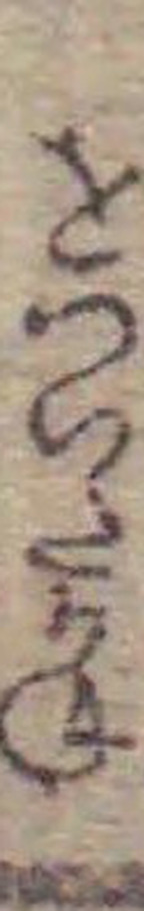をついたかね
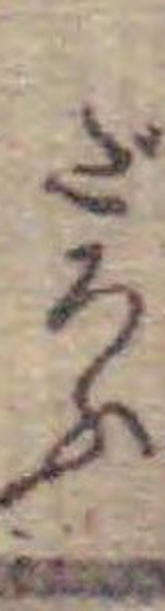だろう
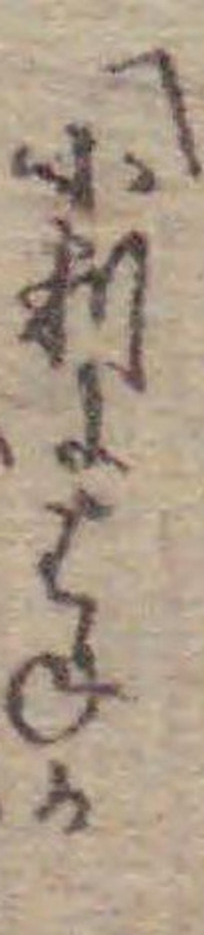〽小判にはねか
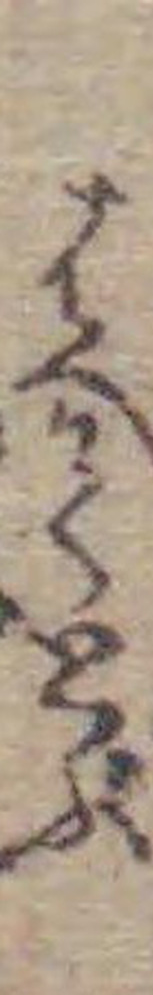はへかくとぶ
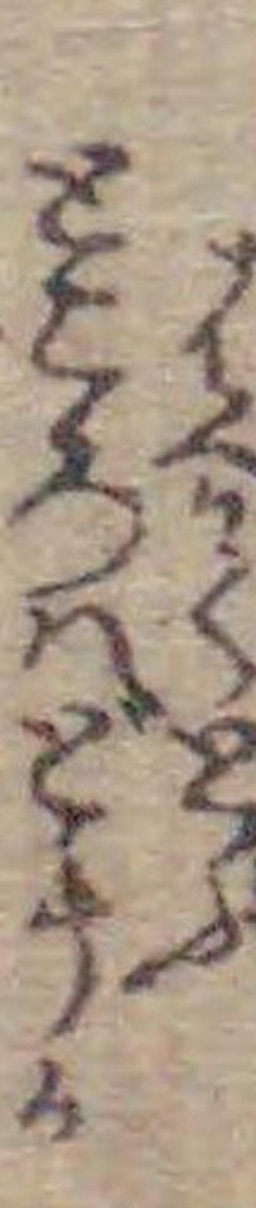ところはどうか
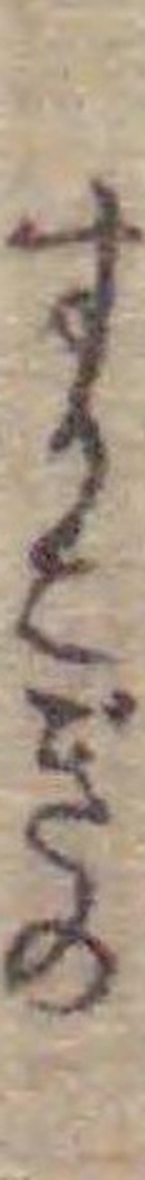すりこぎの
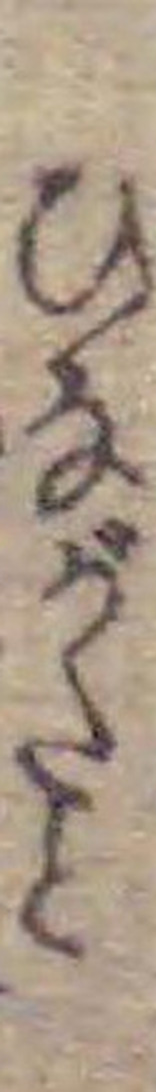ひながたと
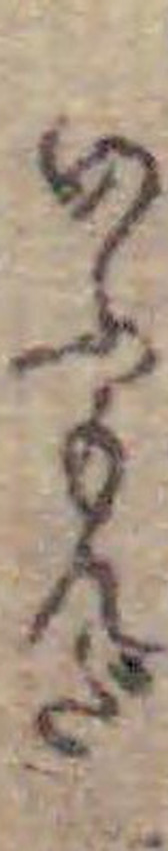いふもんだ

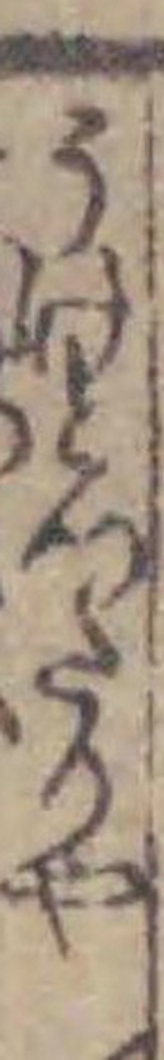うけとつたりや
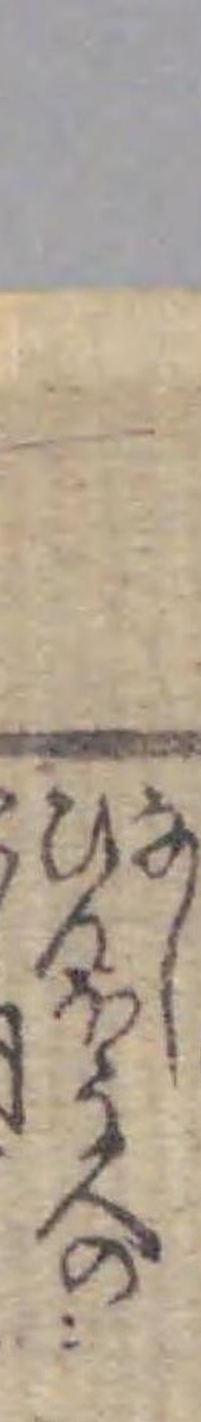ひんほうな人の
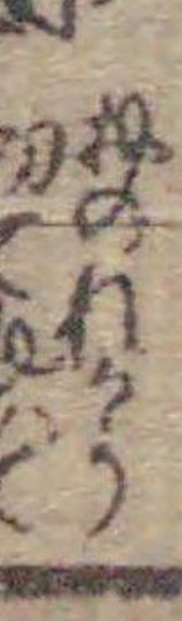おのれから
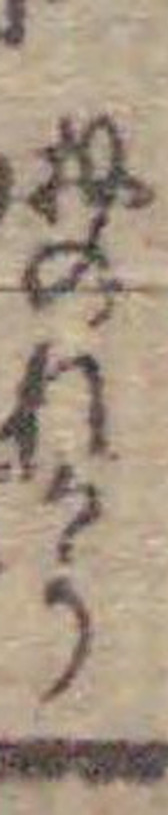おのれから
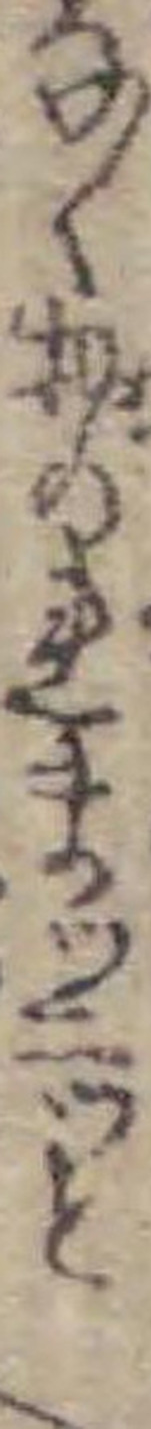なくおのれまつ二つと
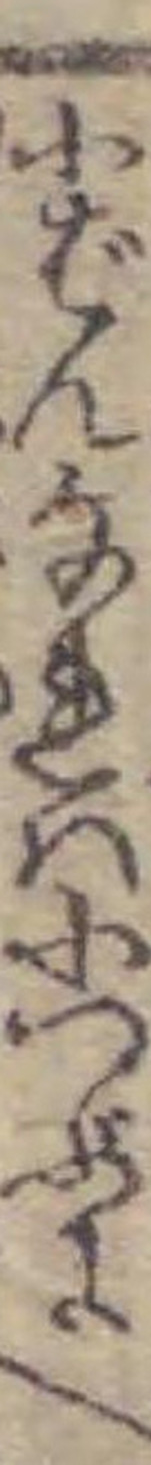小ばんなれは小つぶに
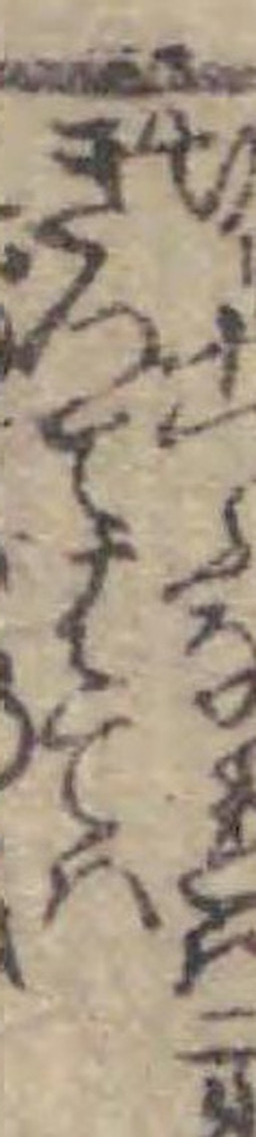きつてはては
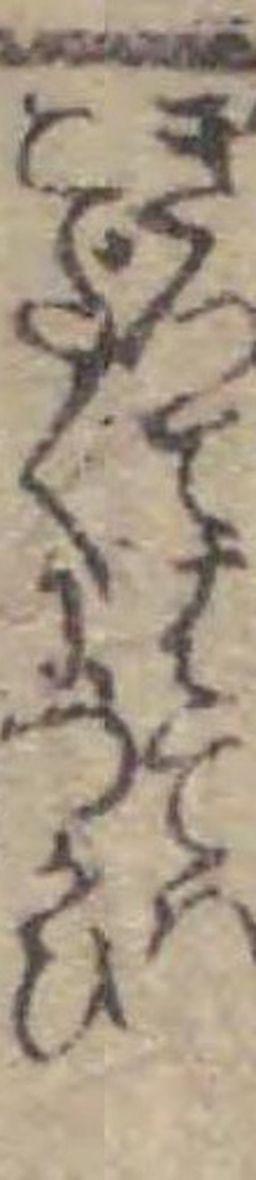こだ〳〵につかひ
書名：新鋳小判 : 3巻
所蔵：国立国会図書館 National Diet Library, JAPAN
